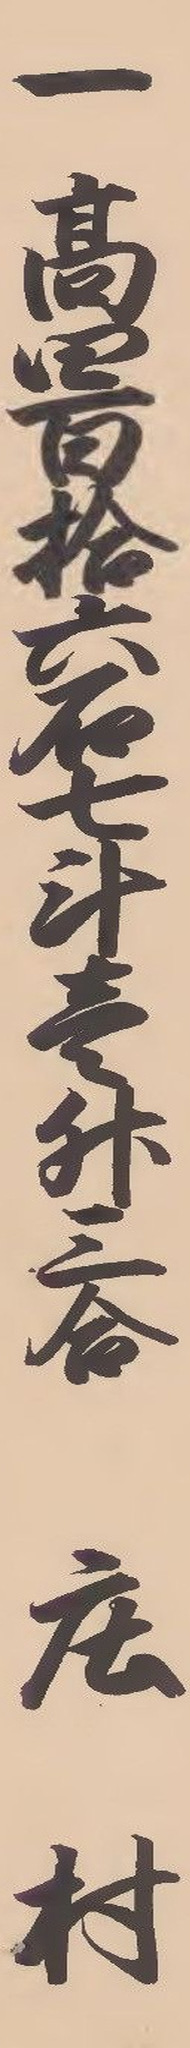一高四百拾六石七斗壱升三合庄村

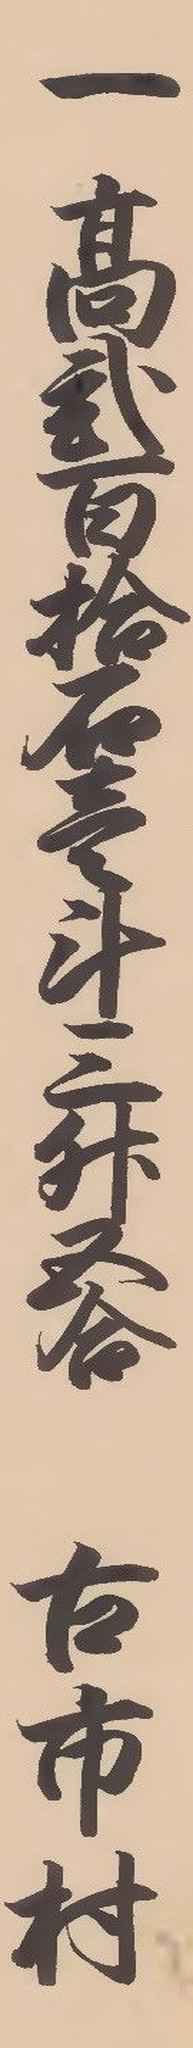一高弐百拾石壱斗三升五合古市村
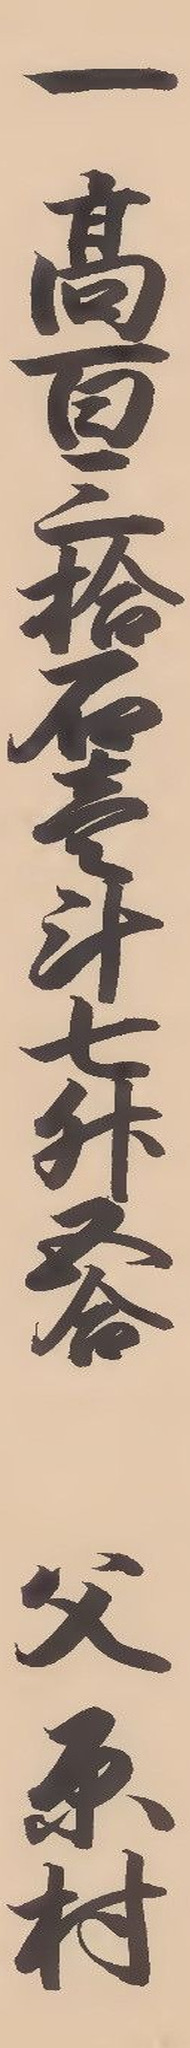一高百三拾石壱斗七升五合父原村
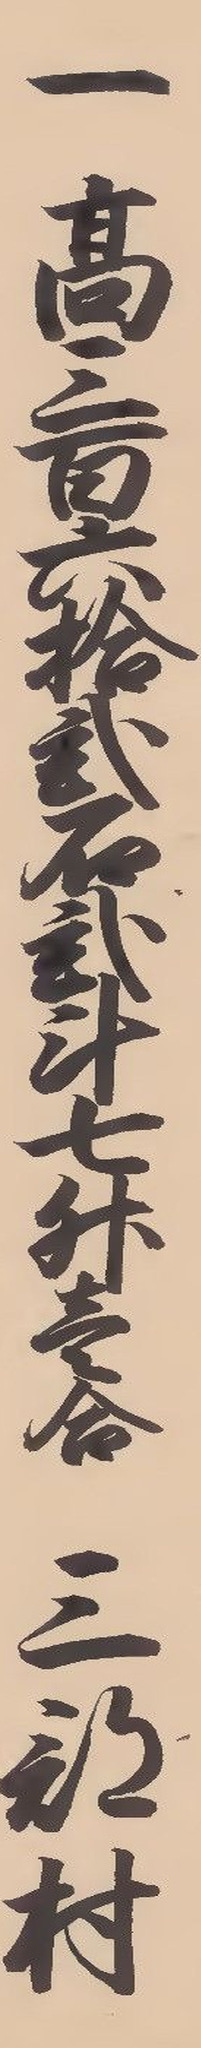一高三百六拾弐石弐斗七升壱合三部村
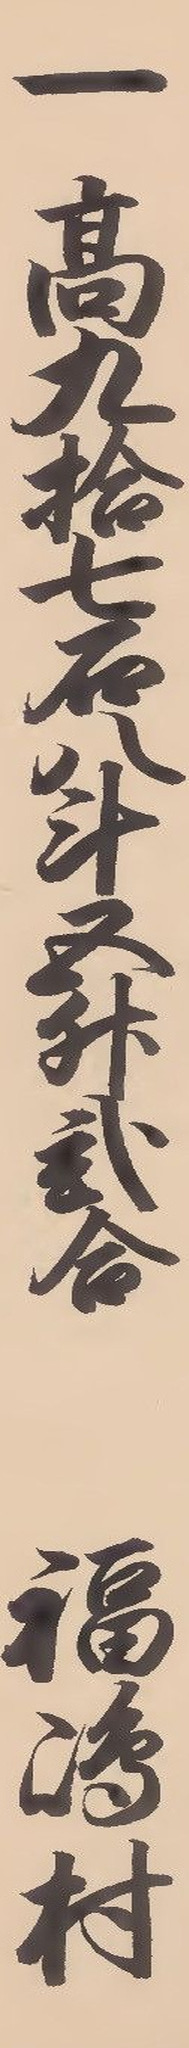一高九拾七石八斗五升弐合福嶋村
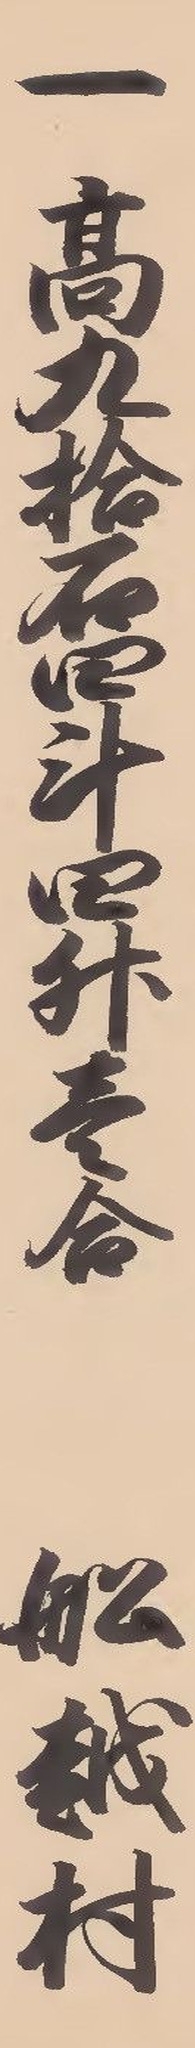一高九拾石四斗四升壱合船越村
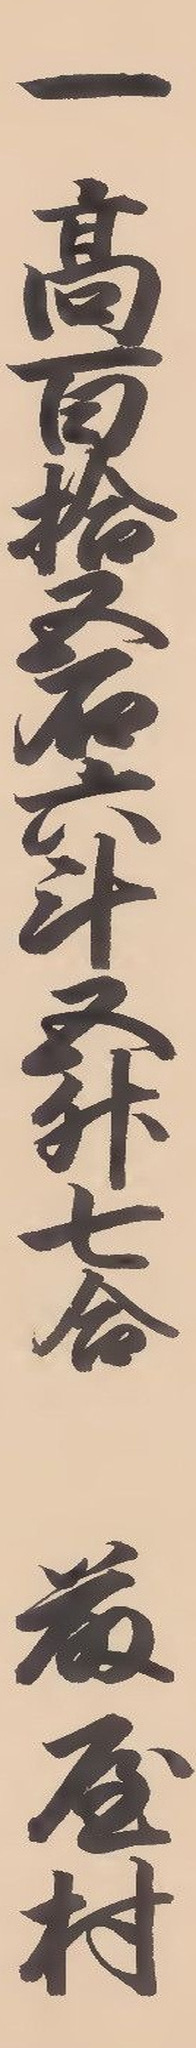一高百拾五石六斗五升七合藤屋村
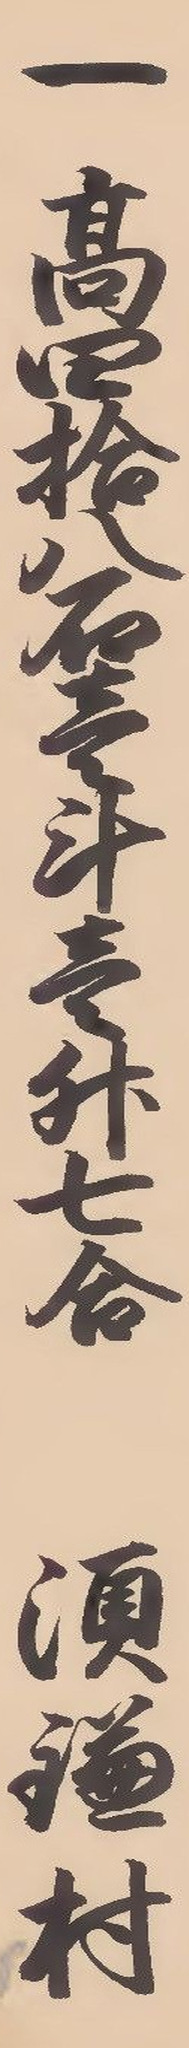一高四拾八石壱斗壱升七合須鎌村

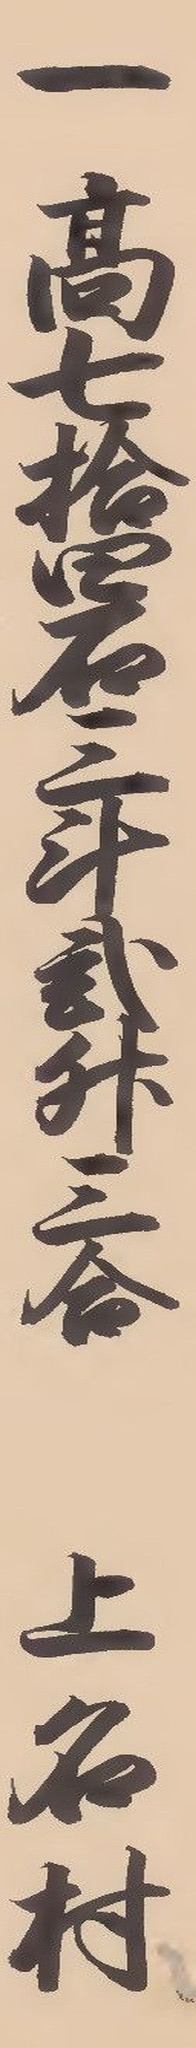一高七拾四石三斗弐升三合上名村
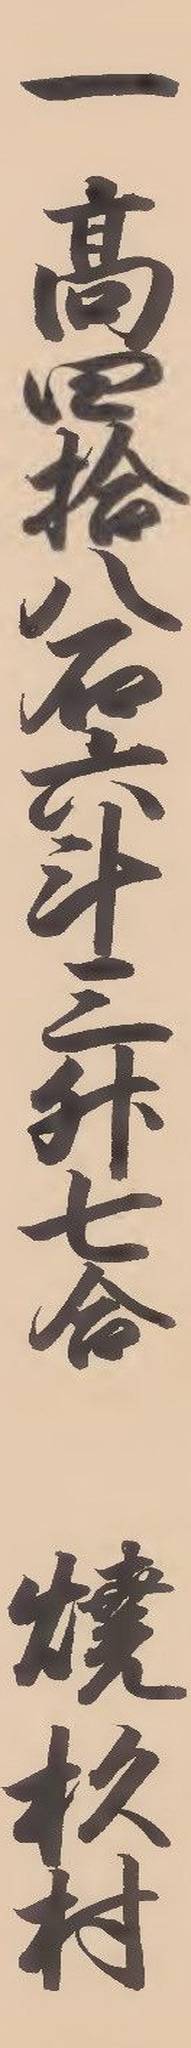一高四拾八石六斗三升七合焼杉村
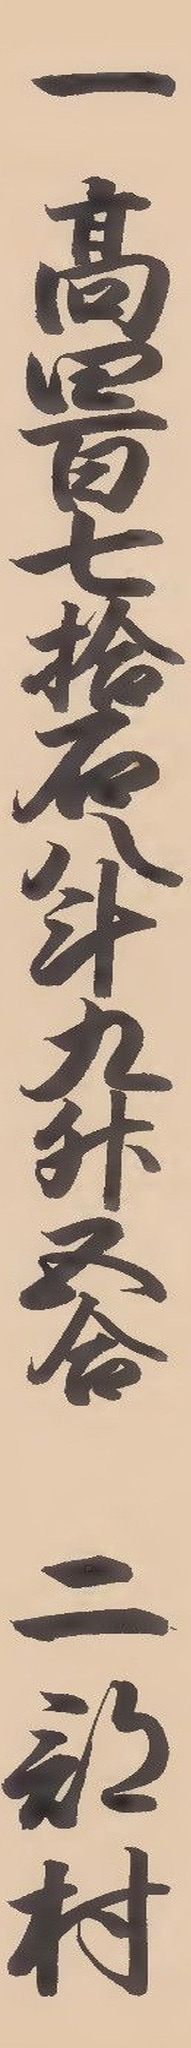一高四百七拾石八斗九升五合二部村
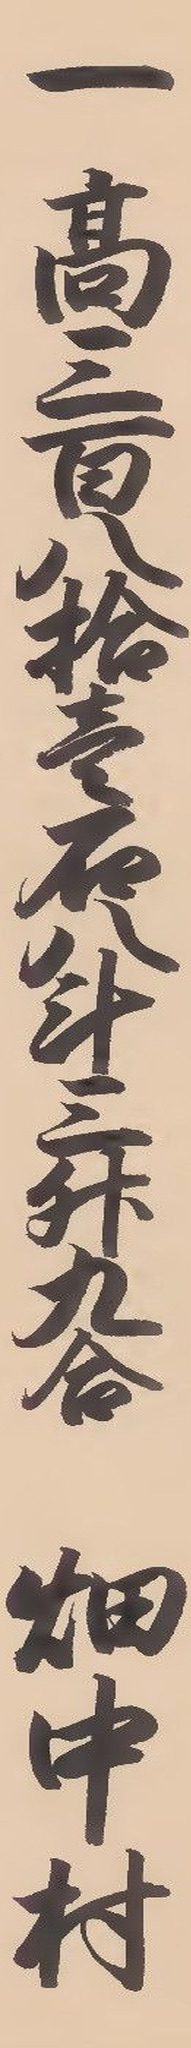一高三百八拾壱石八斗三升九合畑中村
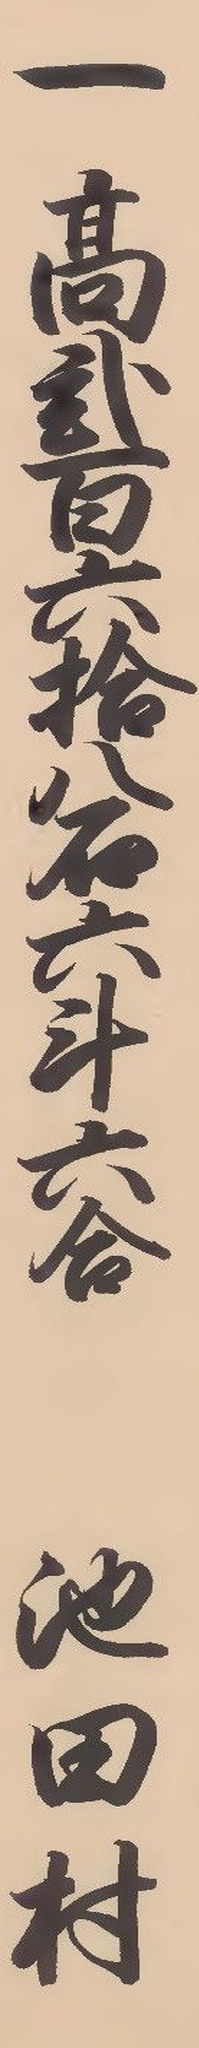一高弐百六拾八石六斗六合池田村
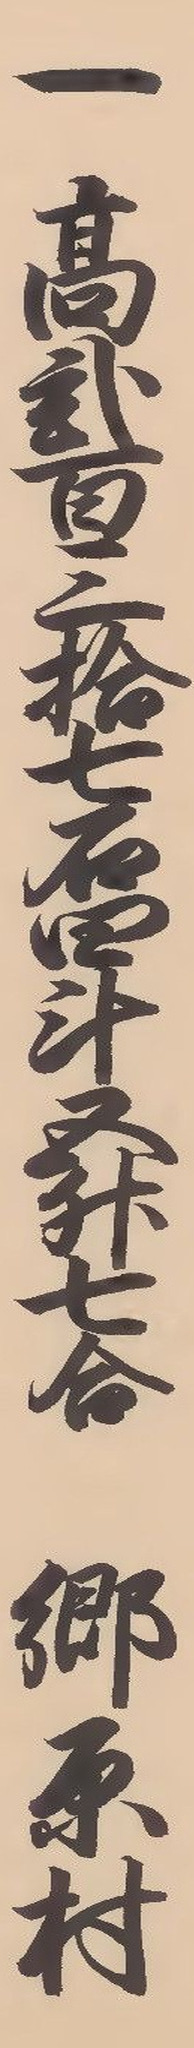一高弐百三拾七石四斗五升七合郷原村
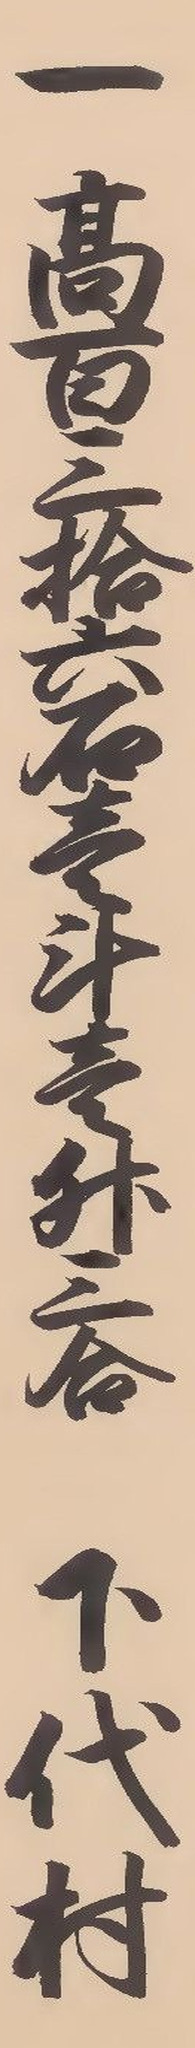一高百三拾六石壱斗壱升三合下代村
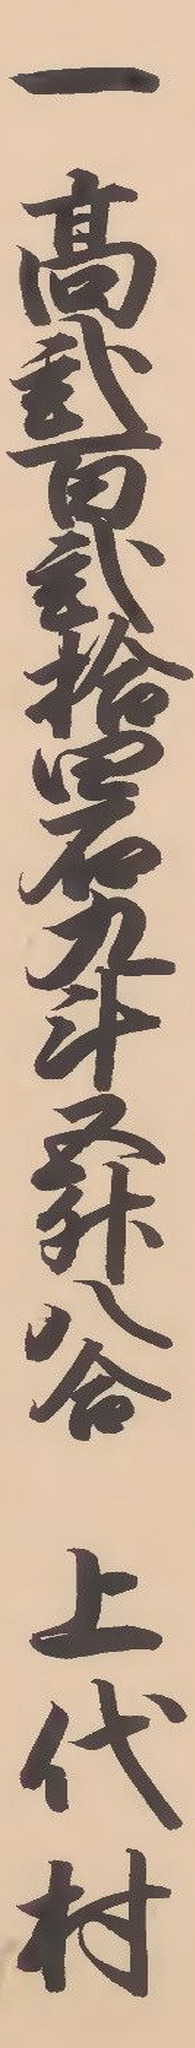一高弐百弐拾四石九斗五升八合上代村
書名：伯耆国郷帳
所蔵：国立公文書館 National Archives of Japan
